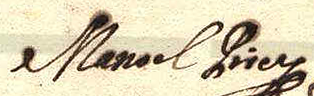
Manoel Pires
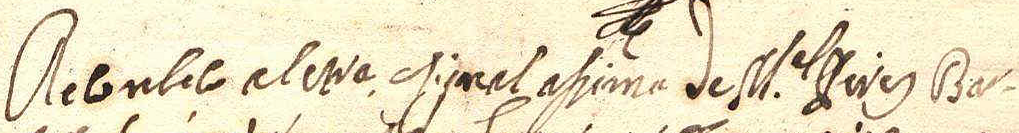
ReconheÇo a letra, e signal assima de M.el Pires Bar
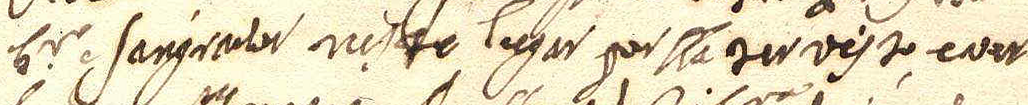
b.ro e sangrador neste lugar por lha ter visto, e ver
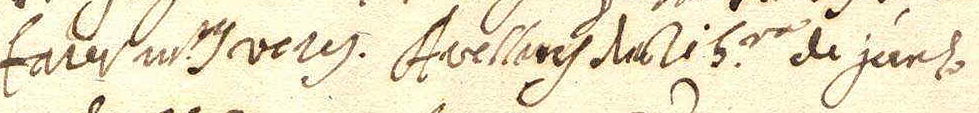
fazer m.tas vezes. Avellans da Rib.ra de junho
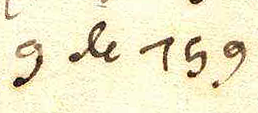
9 de 759
